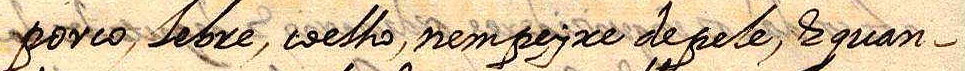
porco, Lebre, coelho, nem peyxe de pele, E quan
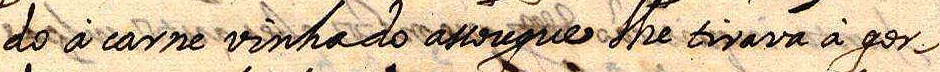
do a carne vinha do assougue lhe tirava a gor
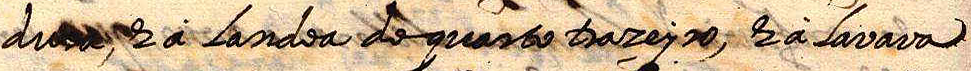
dura, E a landoa do quarto trazeyro, E a Lavava
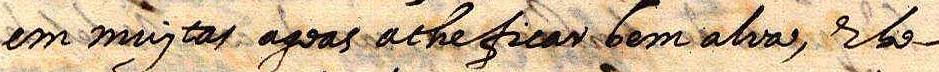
em muytas agoas athe ficar bem alva, E bo
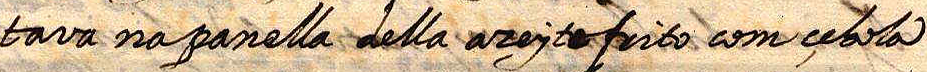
tava na panella della azeyte frito com çebola
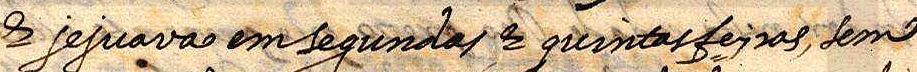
E jejuava em segundas E quintas feyras, sem
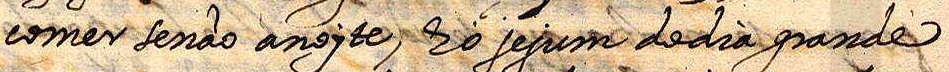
comer senão a noyte, E o jejum do dia grande
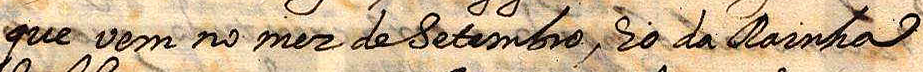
que vem no mez de Setembro, E o da Rainha
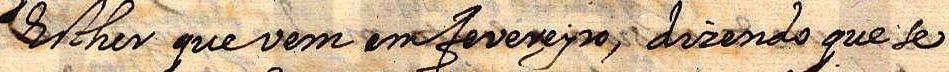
Esther que vem em fevereyro, dizendo que se
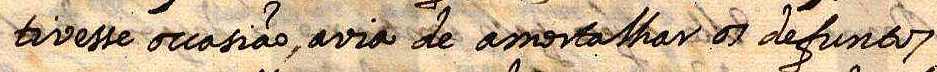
tivesse occasião, avia de amortalhar os defuntos
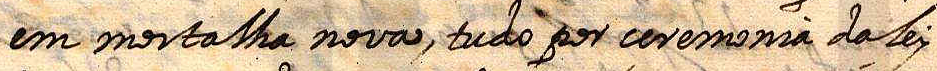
em mortalha nova, tudo por çeremonia da ley
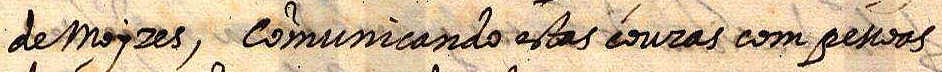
de Moyzes, cōmunicando estas couzas com pessoas
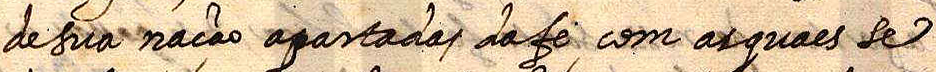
de sua nação apartadas da fe, com as quaes se
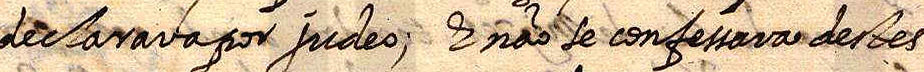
declarava por judeo; E não se confessava destes
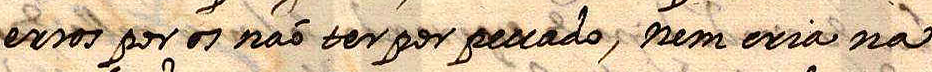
erros por os naõ ter por peccado, nem cria na
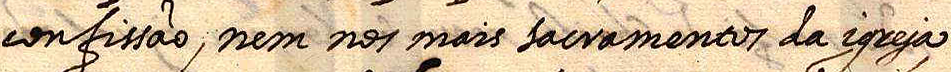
confissão, nem nos mais sacramentos da igreia,
